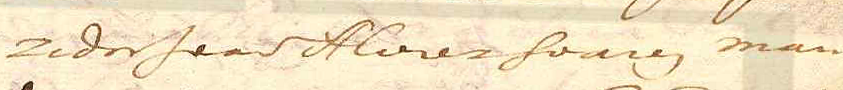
zedor Joaõ Alvrez soares man
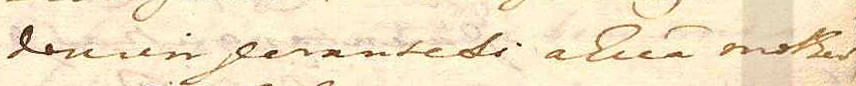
dou uir perante si a huā molher
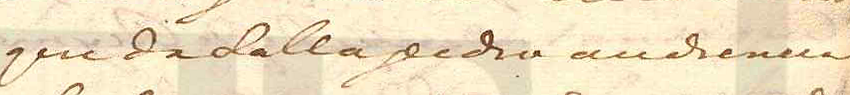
que da salla pedio audiencia
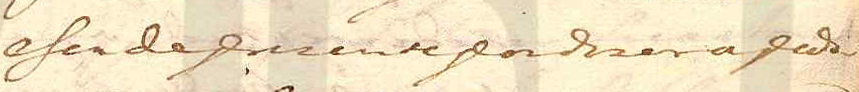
e sendo prezente por dizer a pedi
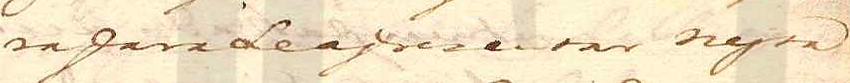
ra para se aprezentar nesta
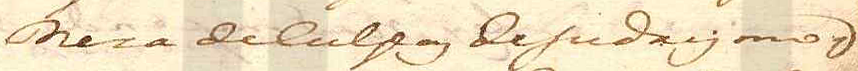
Meza de culpas de judaismo q̄
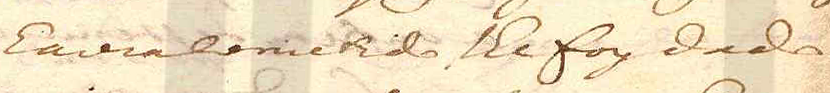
havera cometido lhe foy dado
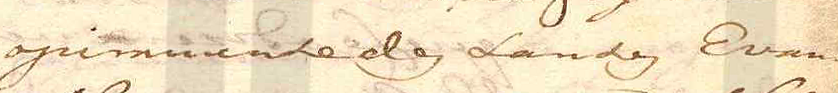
o juramento dos Santos Evan
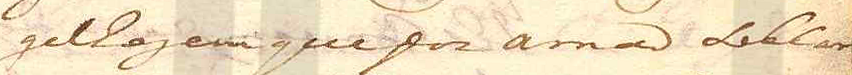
gelhos em que pos a maõ sob car
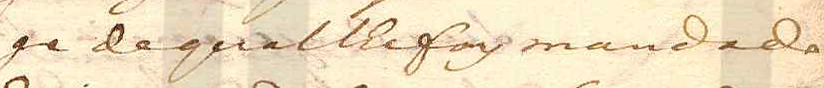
go do qual lhe foy mandado
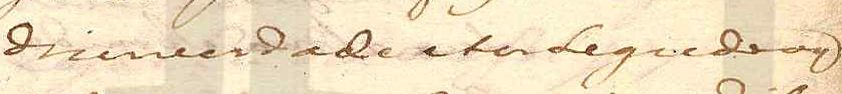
dizer verdade e ter segredo o q̄
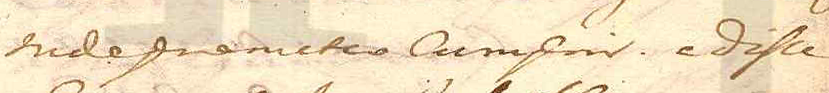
tudo prometeo cumprir. e disse
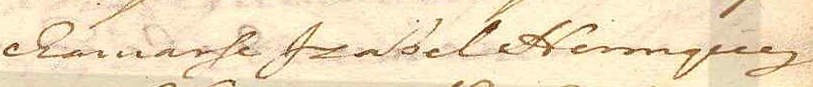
chamarse Jzabel Henriquez
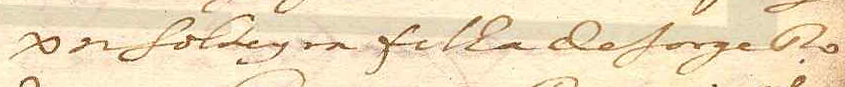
xn solteyra filha de Jorge Ro
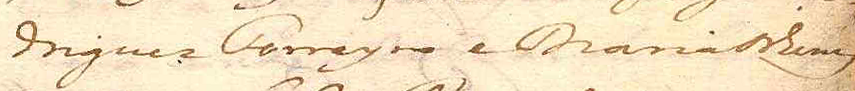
driguez Ferreya e Maria Nunes
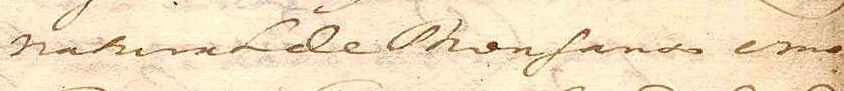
naturaL de Monsanto e mo
